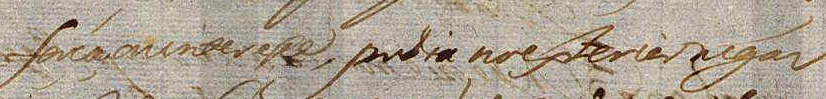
força, ou interesse, podia no exterior negar
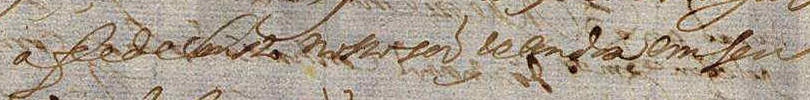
a fee de christo nosso sor̄ retendoa em seu
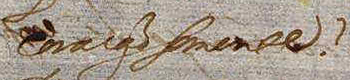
coraçaõ somente?
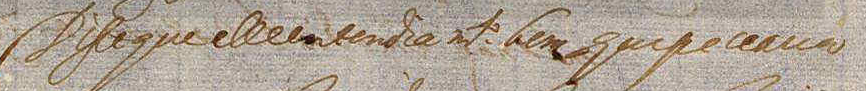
Disse que elle entendia m.to bem que peccaua
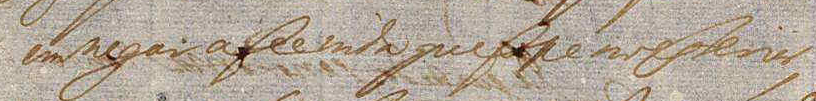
em negar a fee inda que fosse no exterior
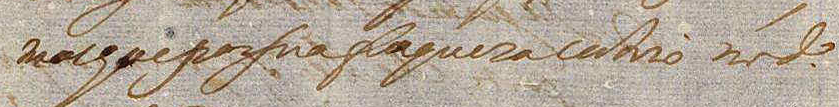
mas que por sua fraqueza cahio no d.o
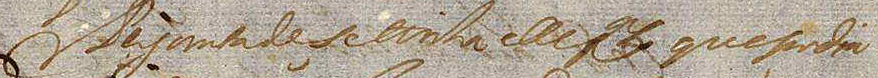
Perguntado se tinha elle pa sy que podia
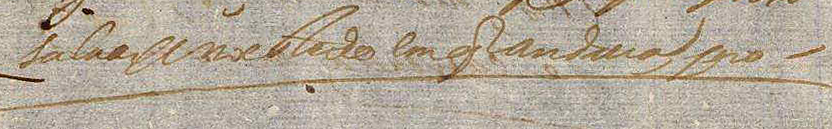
saluarse no estado em q̄ andaua, pro
